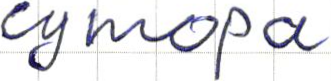сутора
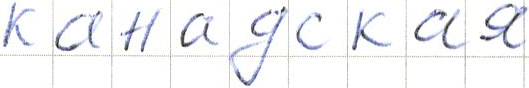канадская
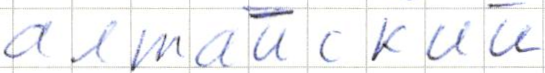алтайский
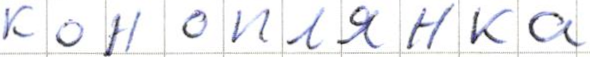коноплянка
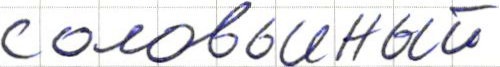соловьиный
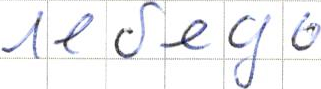лебедь
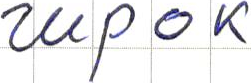чирок
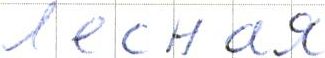лесная
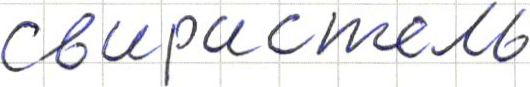свиристель
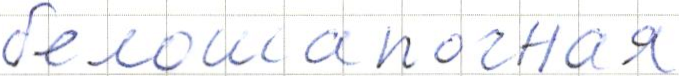белошапочная
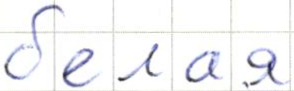белая
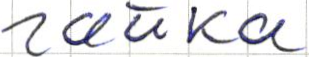чайка
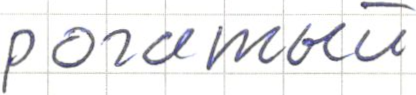рогатый
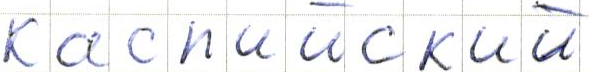каспийский
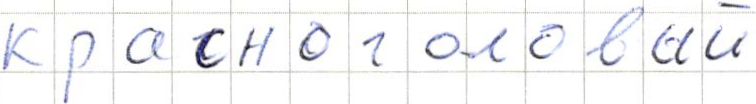красноголовый
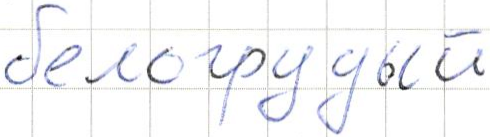белогрудый
